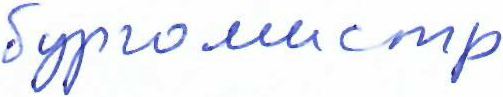бургомистр
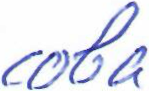сова
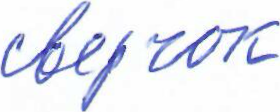сверчок
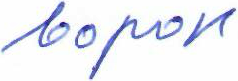ворон
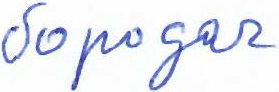бородач
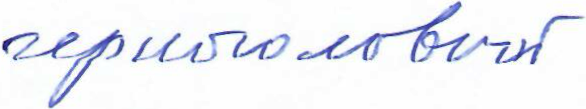черноголовый
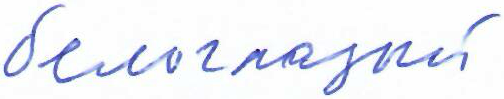белоглазый
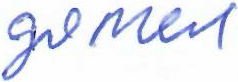дятел
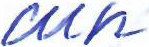сип
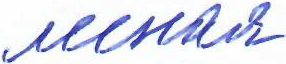лесная
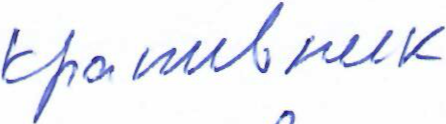крапивник
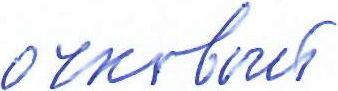очковый
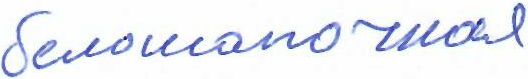белошапочная
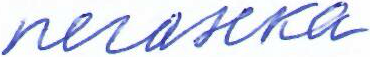пеганка
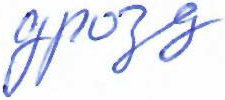дрозд
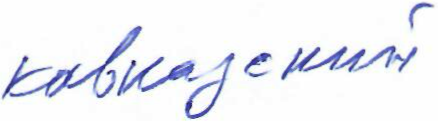кавказский
